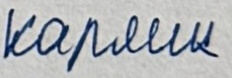карлик
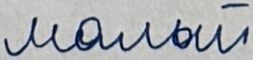малый
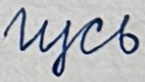гусь
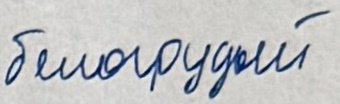белогрудый
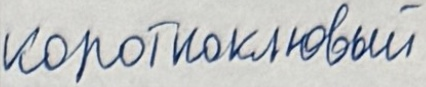короткоклювый
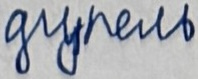дупель
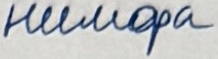нимфа
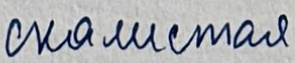скалистая
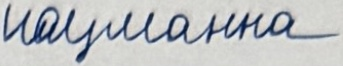науманна
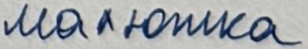малютка
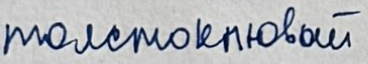толстоклювый
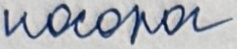носорог
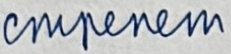стрепет
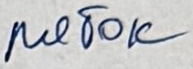рябок
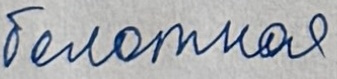белотная
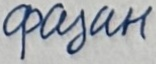фазан
